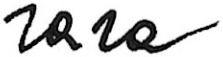гага
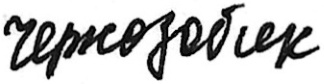чернозобик
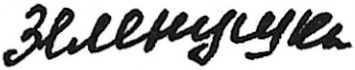зеленушка
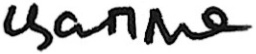цапля
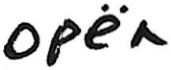орёл
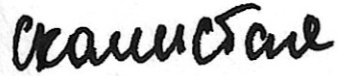скалистая
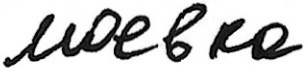моевка
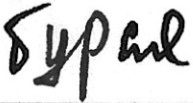бурая
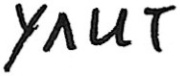улит
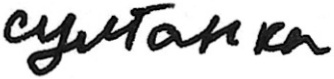султанка
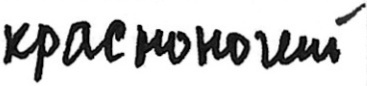красноногий
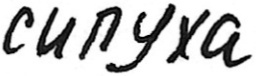сипуха
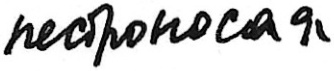пестроносая
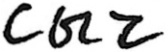сыч
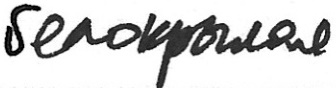белокрылая
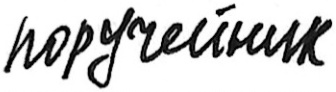поручейник
